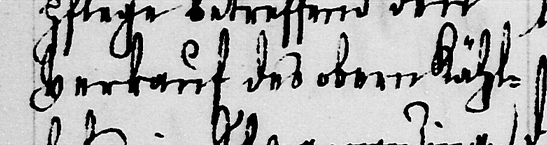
Verkauf des obern Kähl¬
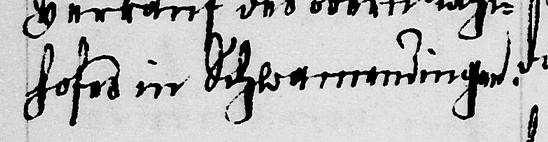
hofes in Schwamendingen.
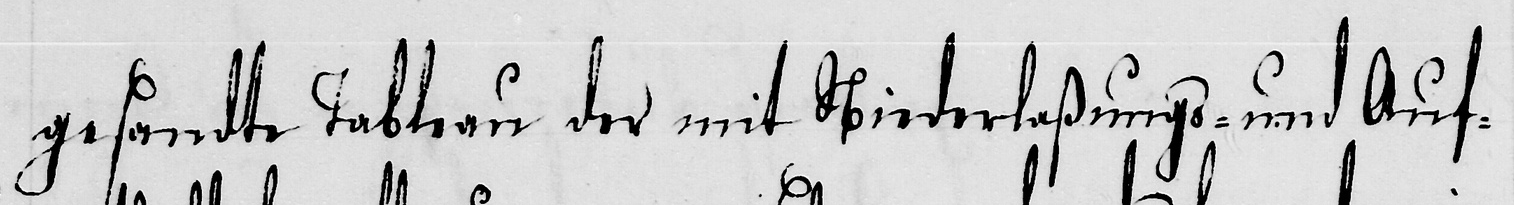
gesandte Tableau der mit Niederlaßungs- und Auf¬
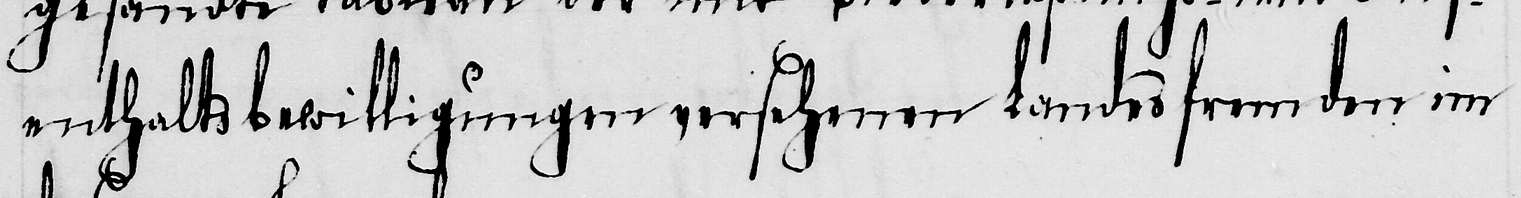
enthaltsbewilligung versehenen Landesfremden im
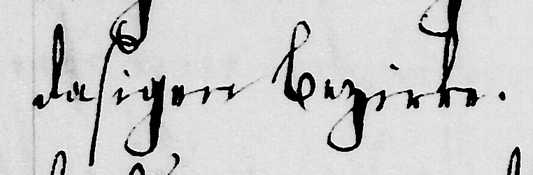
dasigen Bezirke.
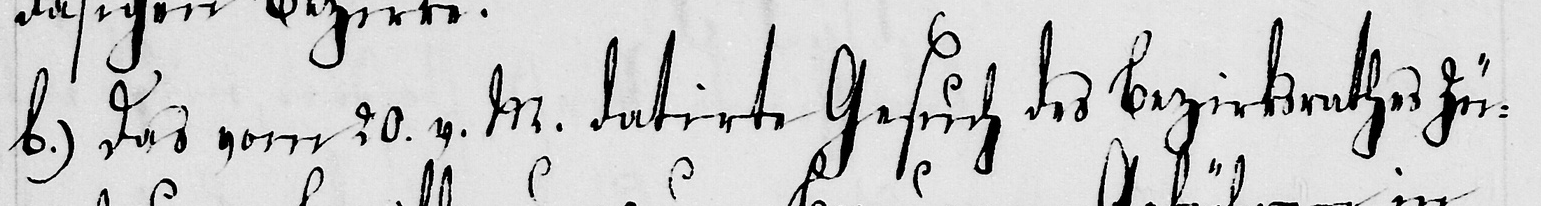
b.) Das vom 20. v. M. datirte Gesuch des Bezirksrathes Zü¬
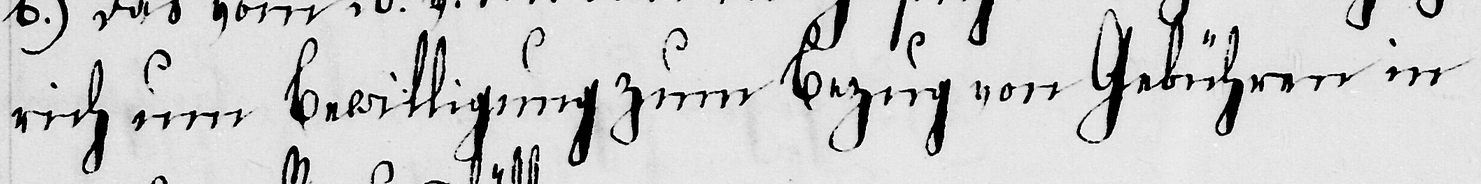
rich um Bewilligung zum Bezug von Gebühren in
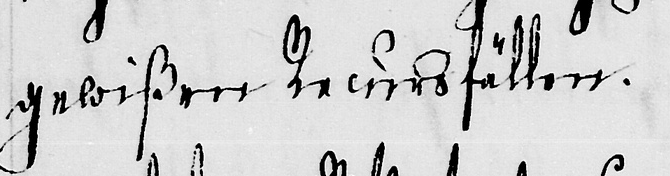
gewißen Recursfällen.
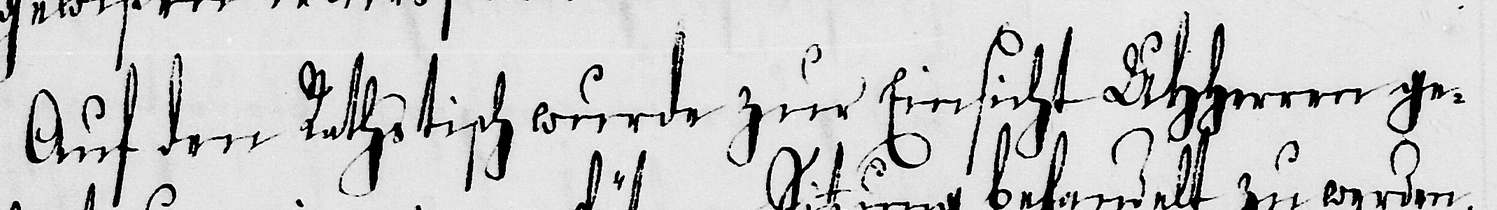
Auf den Rathstisch wurde zur Einsicht UHHerren ge¬
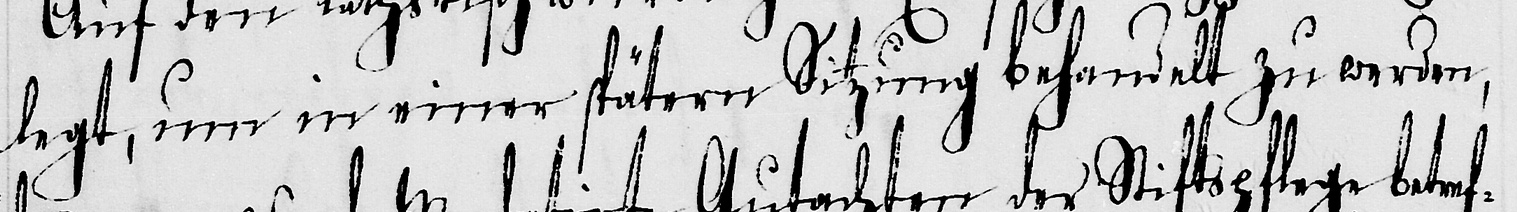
legt, um in einer spätern Sitzung behandelt zu werden,
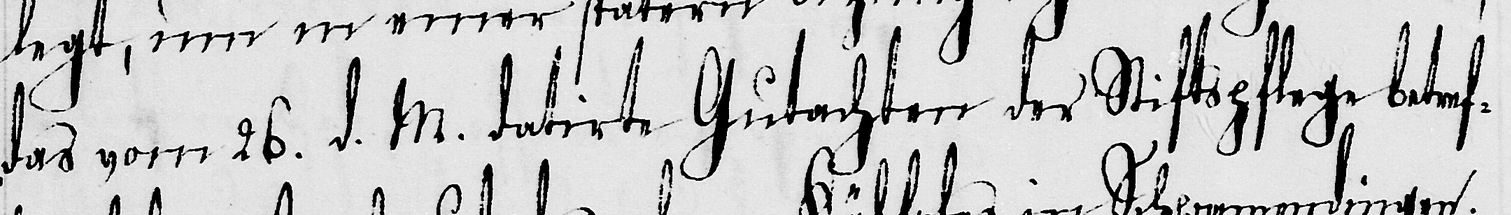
das vom 26. d. M. datirte Gutachten der Stiftspfle¬
